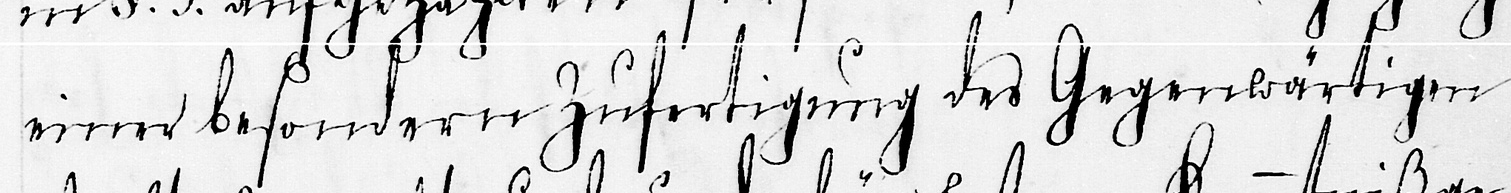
einer besondern Zufertigung des Gegenwärtigen
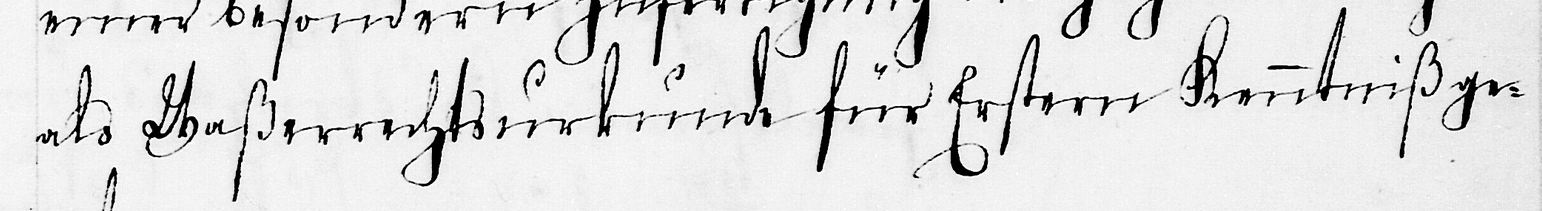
als Waßerrechtsurkunde für Erstern Kenntniß ge¬
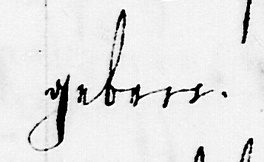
geben.
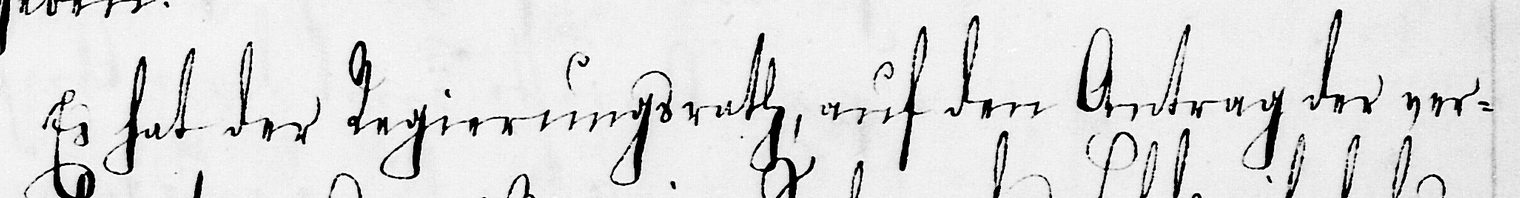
Es hat der Regierungsrath, auf den Antrag der ver¬
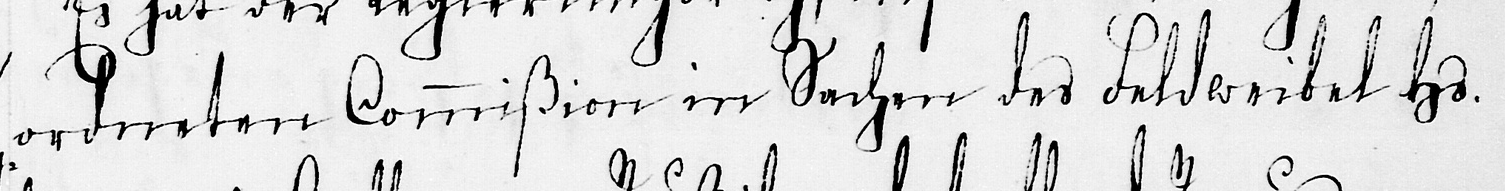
ordneten Commißion in Sachen des Feldweibel Hs.
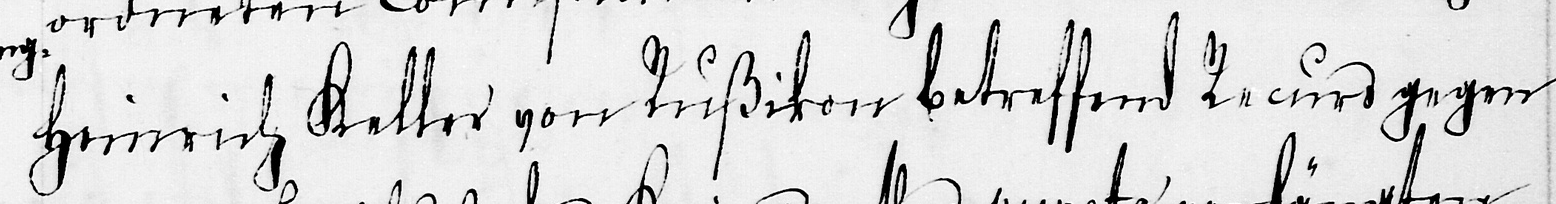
Heinrich Keller von Rußikon betreffend Recurs gegen
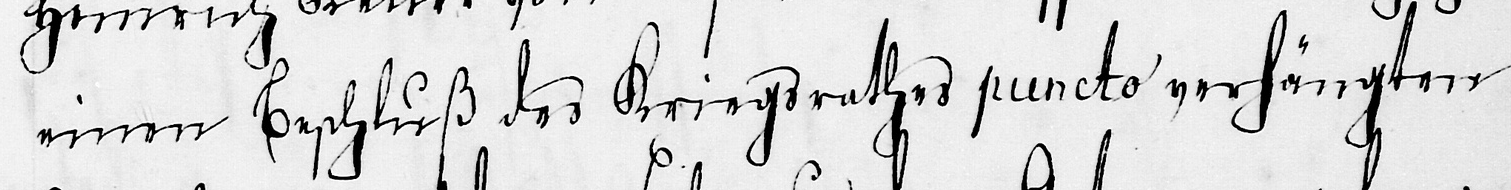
einen Beschluß des Kriegsrathes puncto verhängten
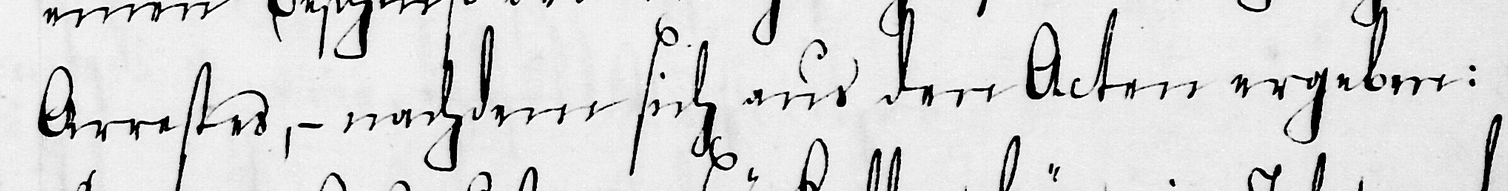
Arrestes, – nachdem sich aus den Acten ergeben:
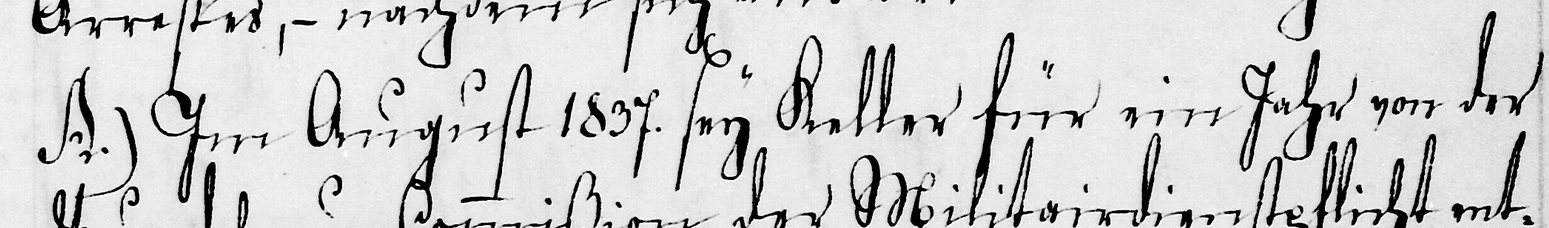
A.) Im August 1837. sey Keller für ein Jahr von der
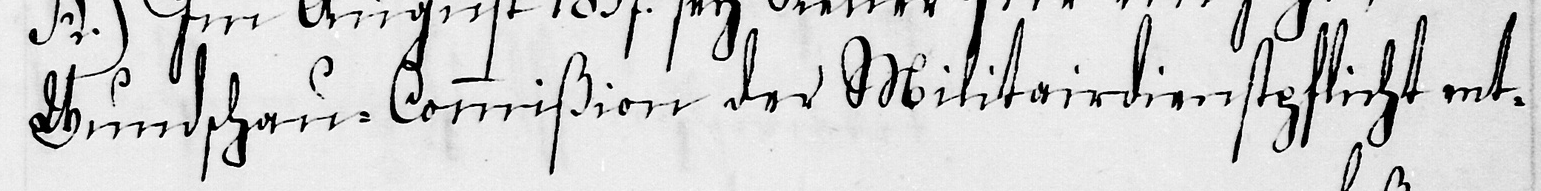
Wundschau-Commißion der Militairdienstpflicht ent-
